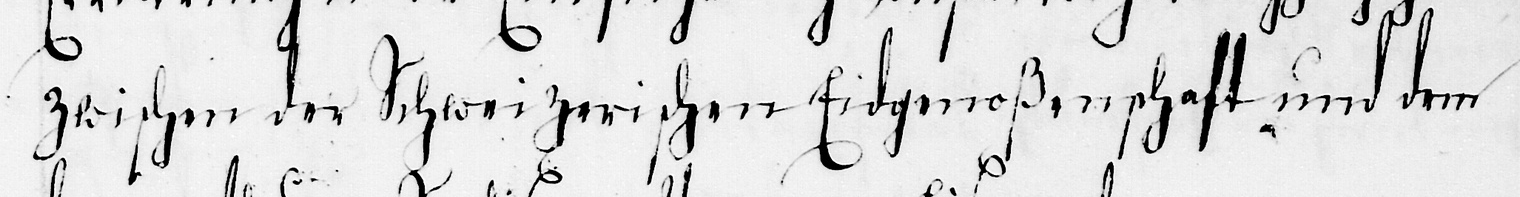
zwischen der Schweizerischen Eidgenoßenschaft und dem
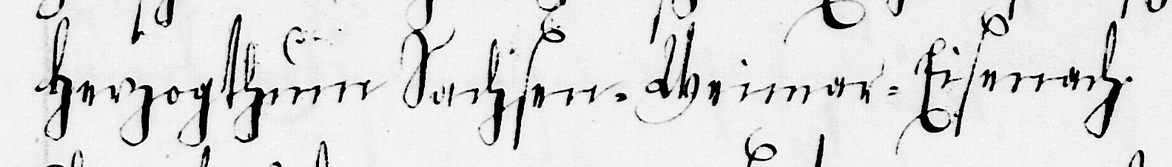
Herzogthum Sachsen-Weimar-Eisenach.
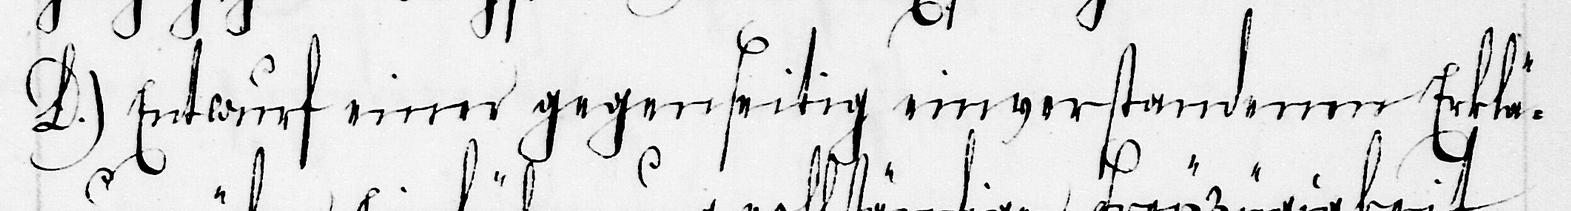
D.) Entwurf einer gegenseitig einverstandenen Erklä¬
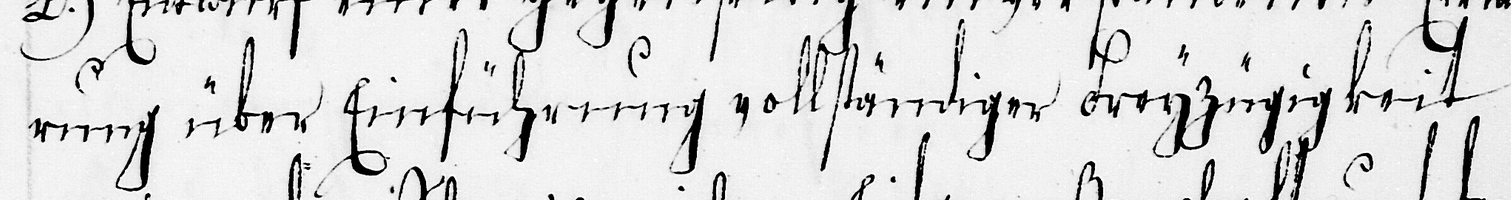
rung über Einführung vollständiger Freyzügigkeit
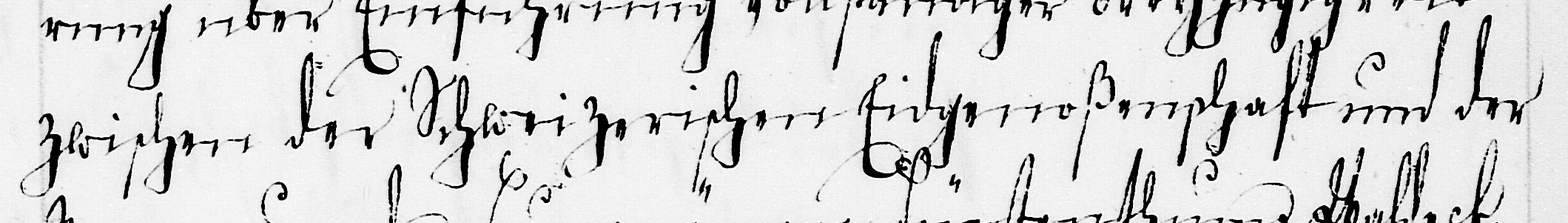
zwischen der Schweizerischen Eidgenoßenschaft und der
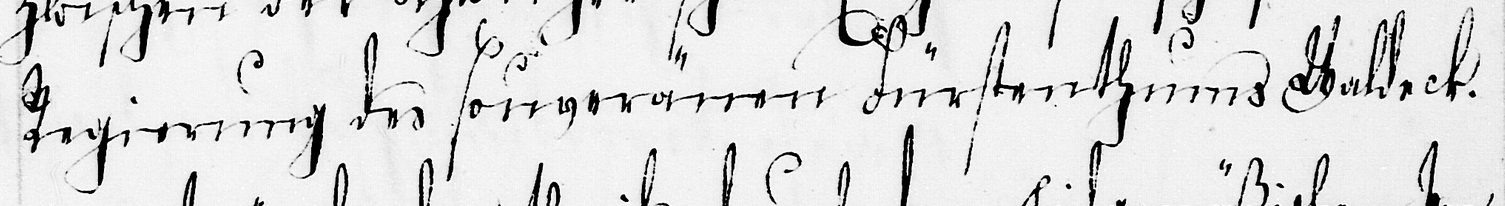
Regierung des souveränen Fürstenthums Waldeck.
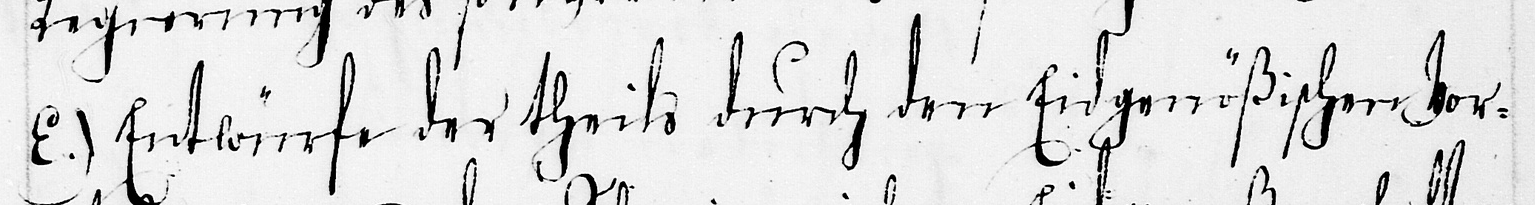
E.) Entwürfe der theils durch den Eidgenößischen Vor¬
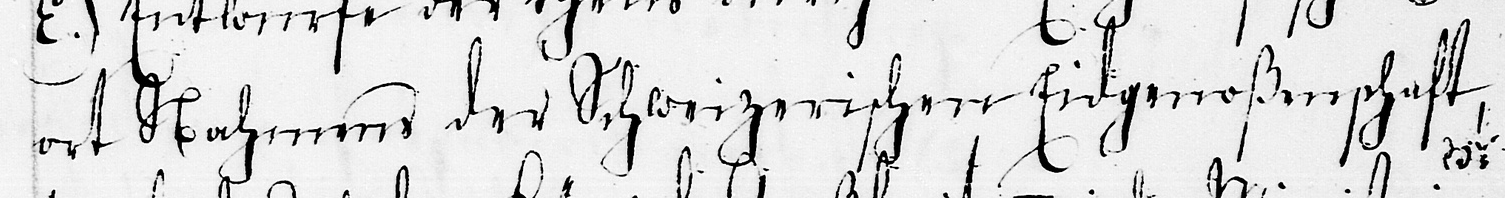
ort Nahmens der Schweizerischen Eidgenoßenschaft,
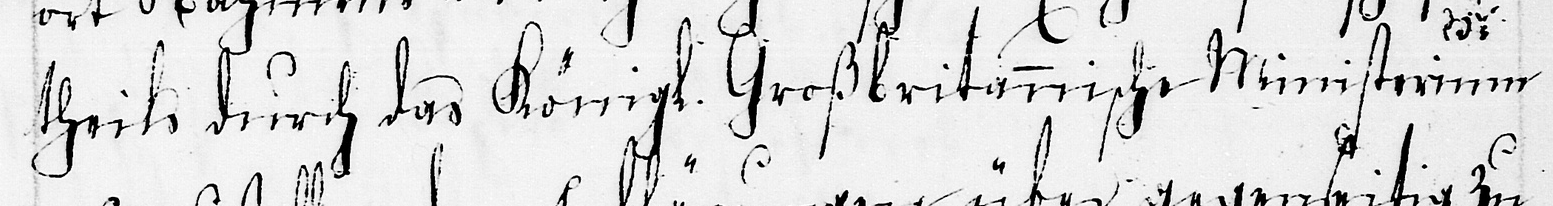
theils durch das Königl. Großbritannische Ministerium
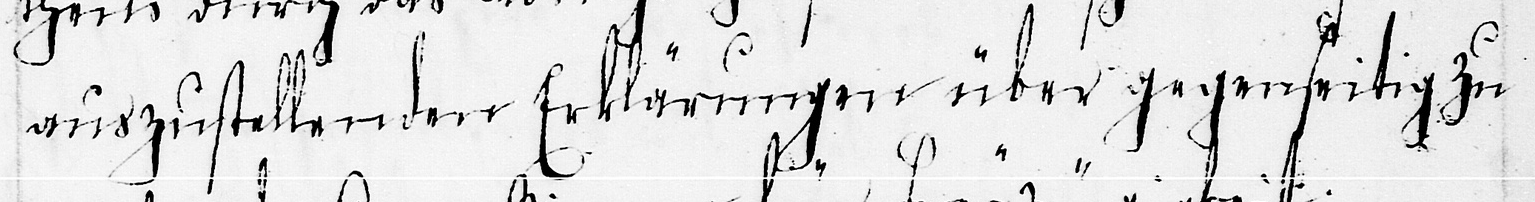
auszustellender Erklärungen über gegenseitig zu
